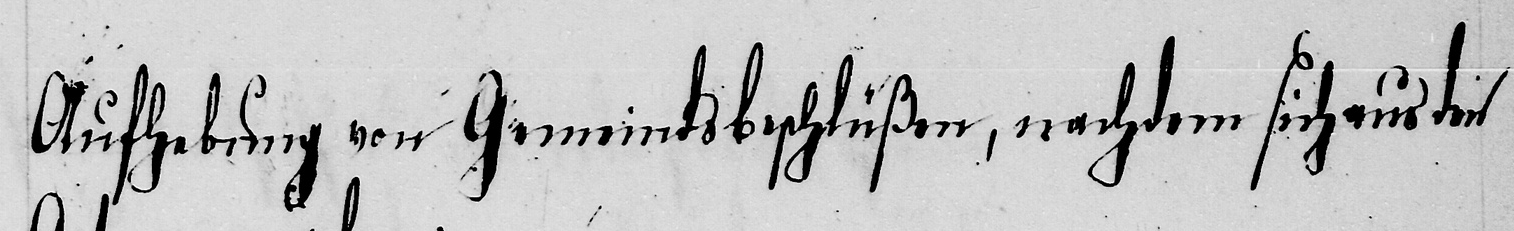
Aufhebung von Gemeindsbeschlüßen, nachdem sich aus den
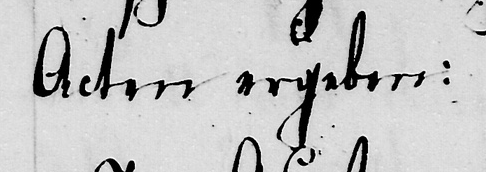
Acten ergeben:
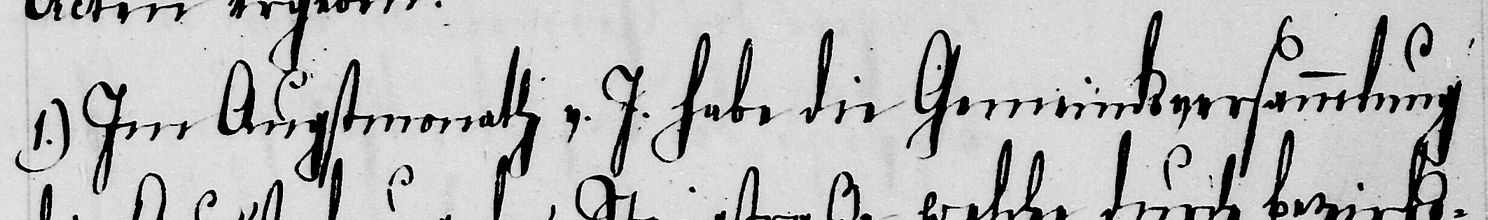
1.) Im Augustmonath v. J. habe die Gemeindsversammlung
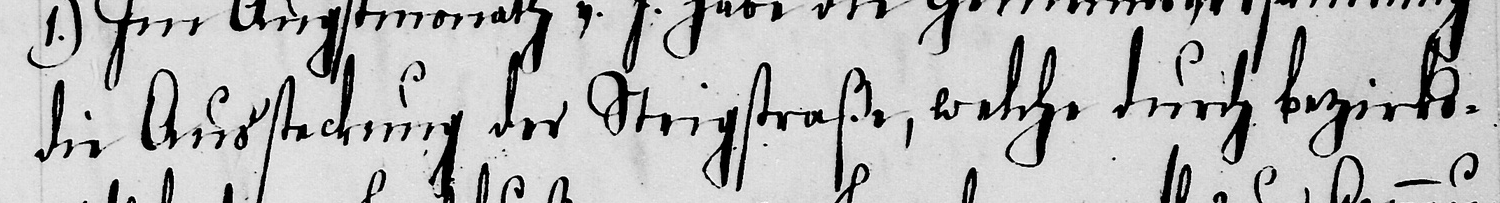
die Aussteckung der Steigstraße, welche durch bezirks¬
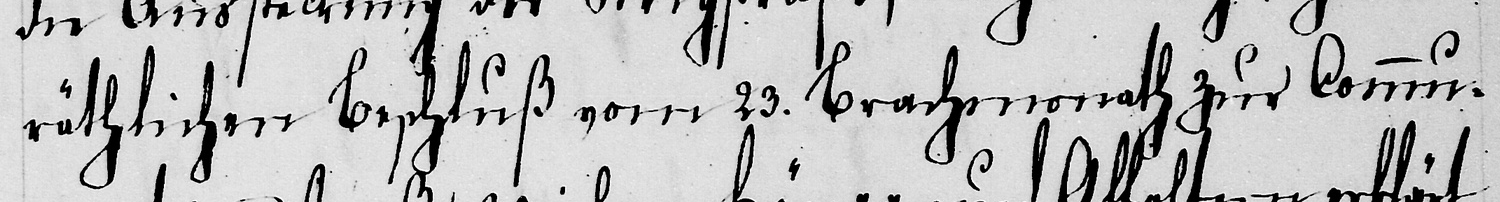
räthlichen Beschluß vom 23. Brachmonath zur Commu¬
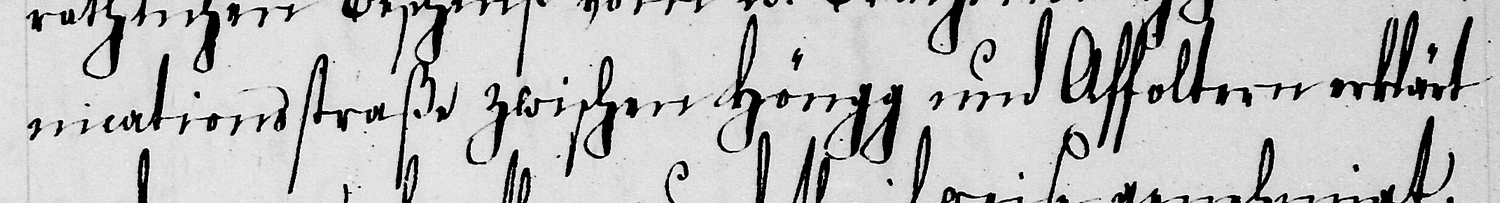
nicationsstraße zwischen Höngg und Affoltern erklärt
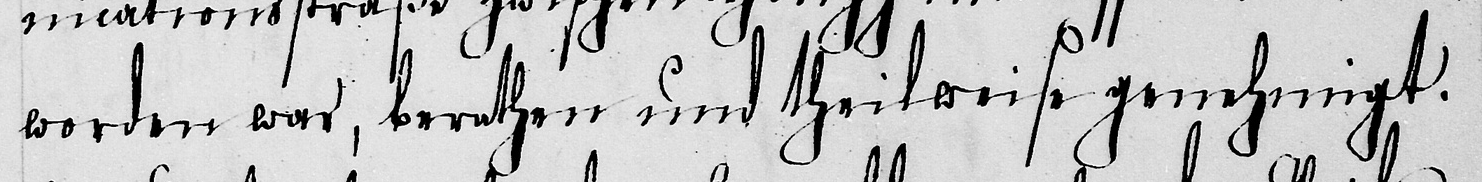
worden war, berathen und theilweise genehmigt.
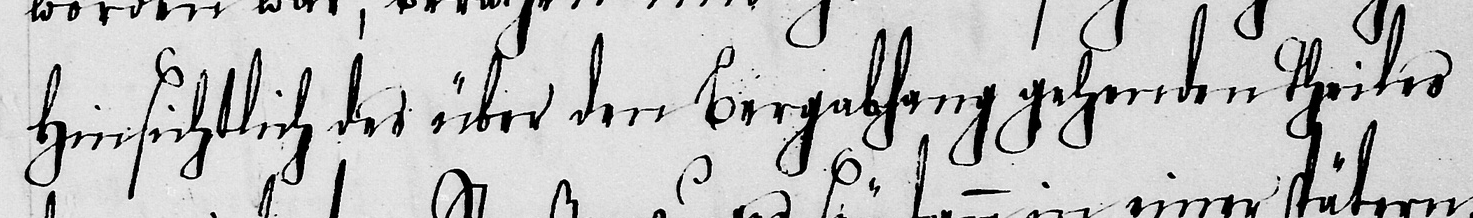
Hinsichtlich des über den Bergabhang gehenden Theiles
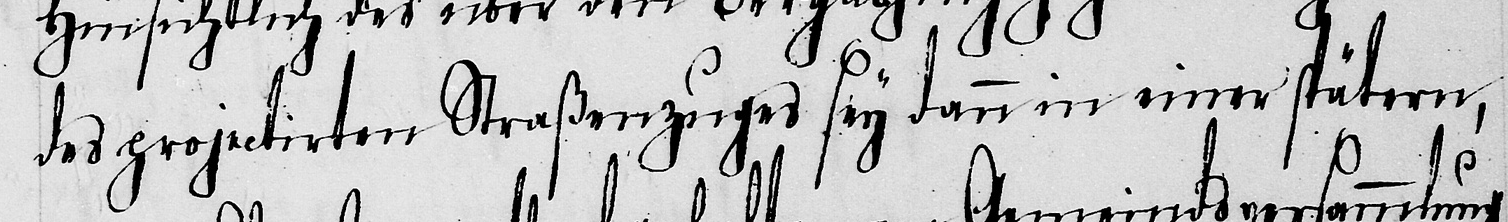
des projectirten Straßenzuges sey dann in einer spätern,
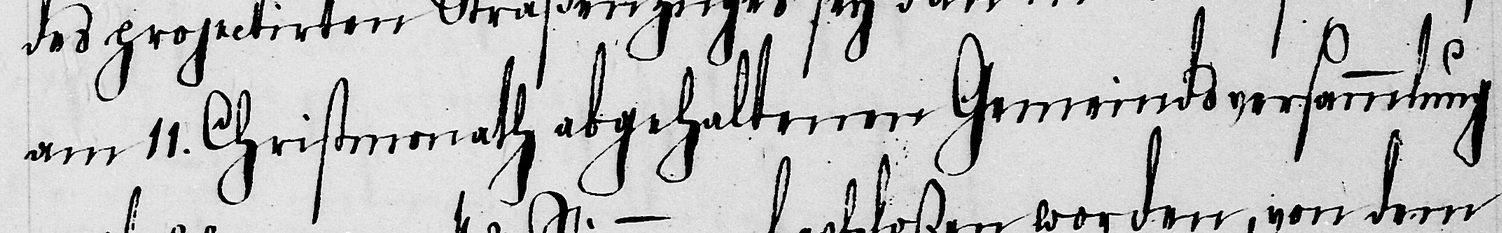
am 11. Christmonath abgehaltenen Gemeindsversammlung
